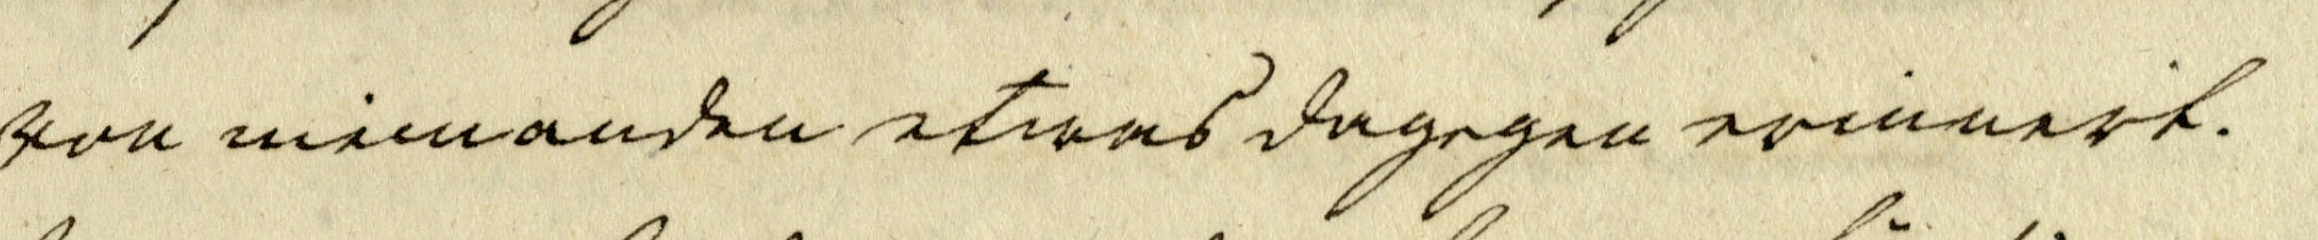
von niemanden etwas dagegen erinnert.
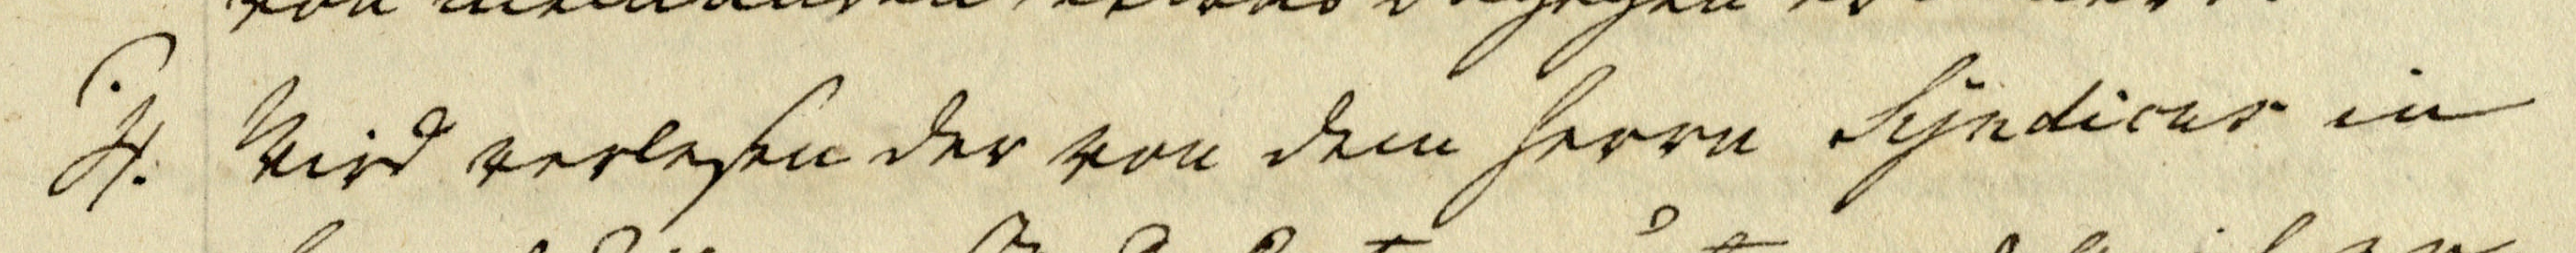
4. Wird verlesen der von dem Herrn Sÿndicus in
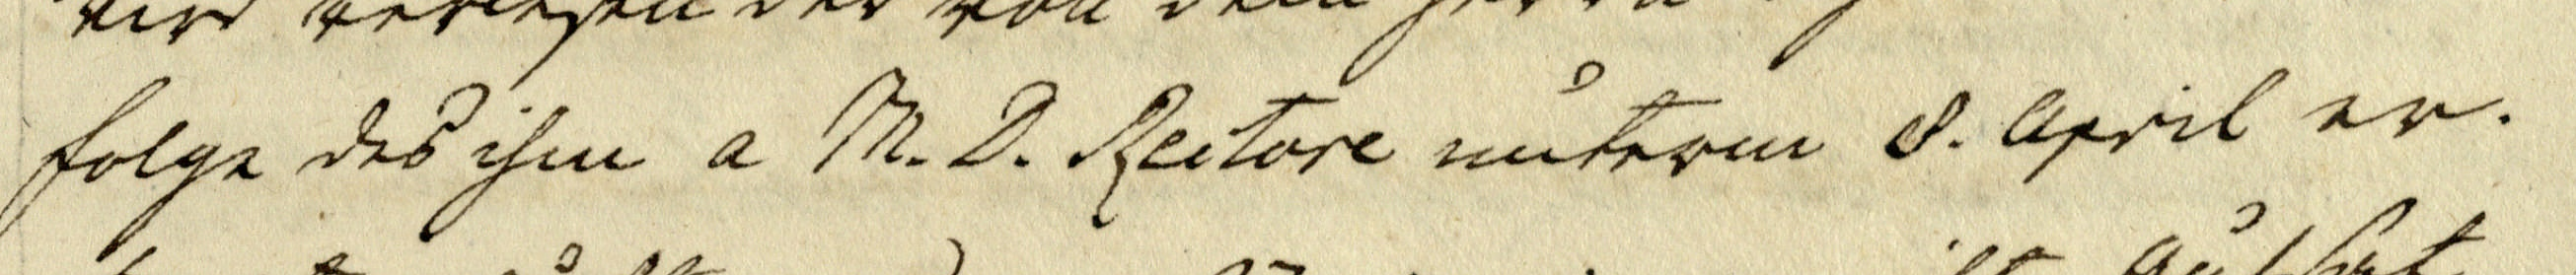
Folge des ihm a M. D. Rectore unterm 8. April er¬
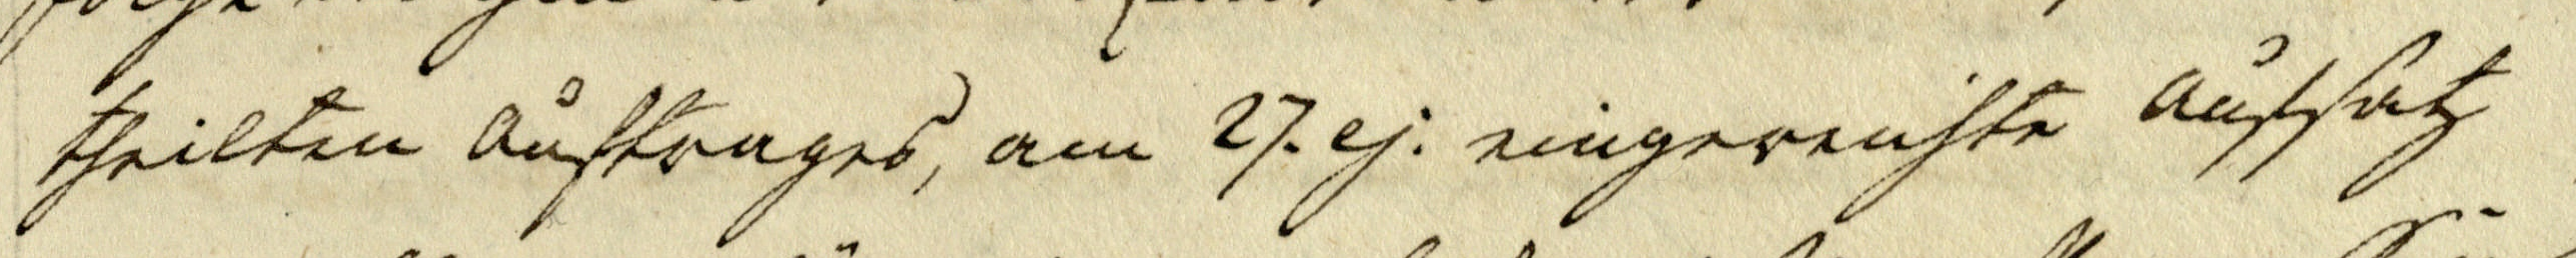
theilten Auftrages, am 27. ej. eingereichte Aufsatz
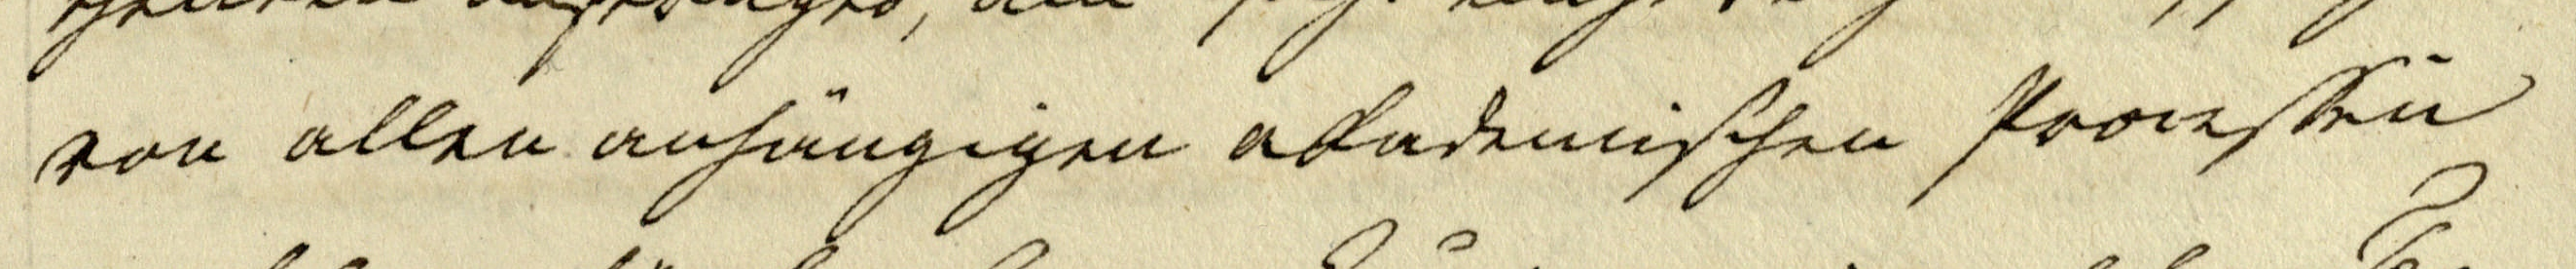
von allen anhängigen akademischen Processen
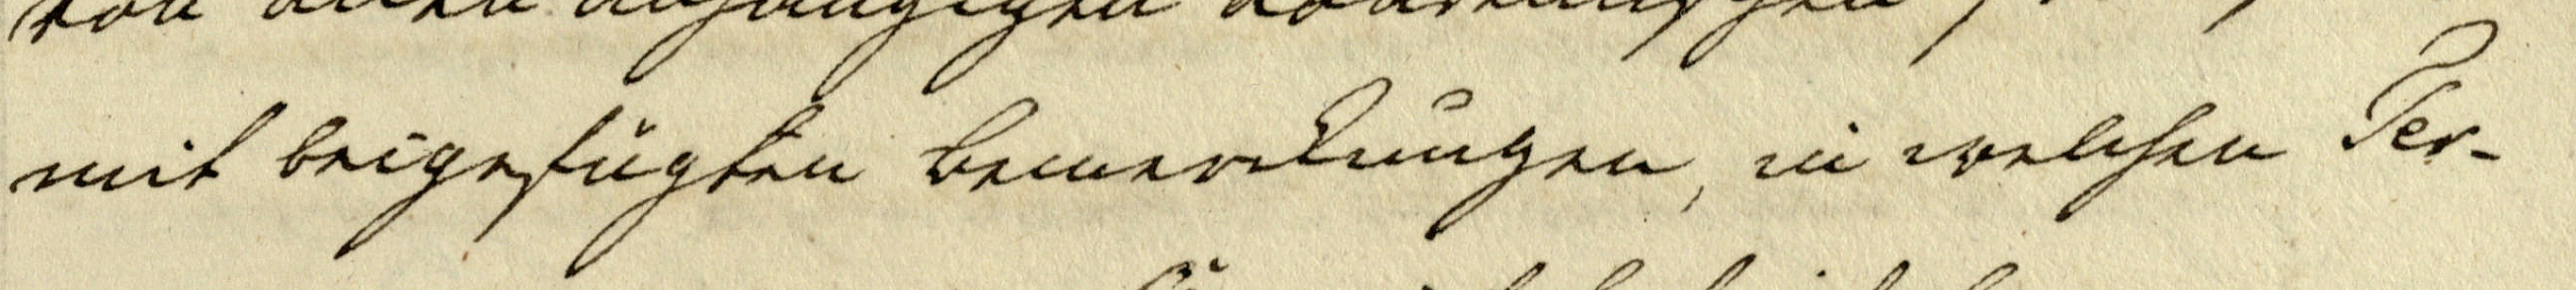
mit beigefügten Bemerkungen, in welchen Ter¬
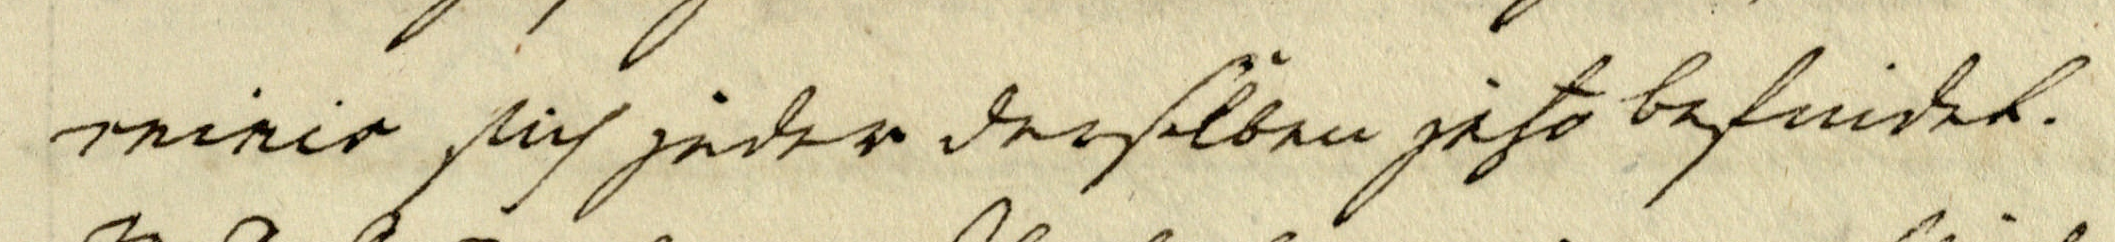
minis sich jeder derselben jetzo befindet¬
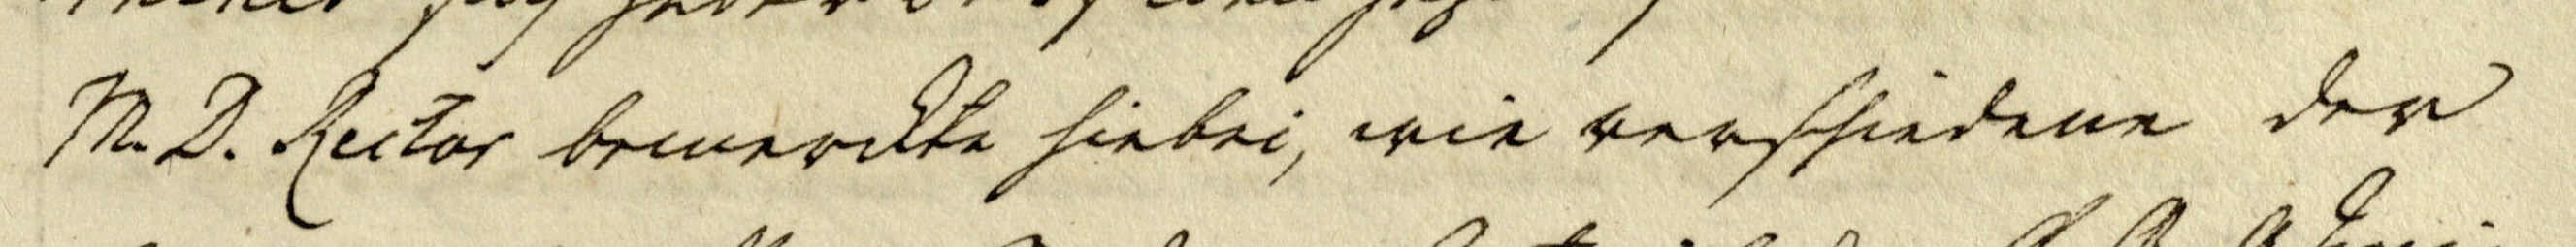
M. D. Rector bemerckte hiebei, wie verschiedene der
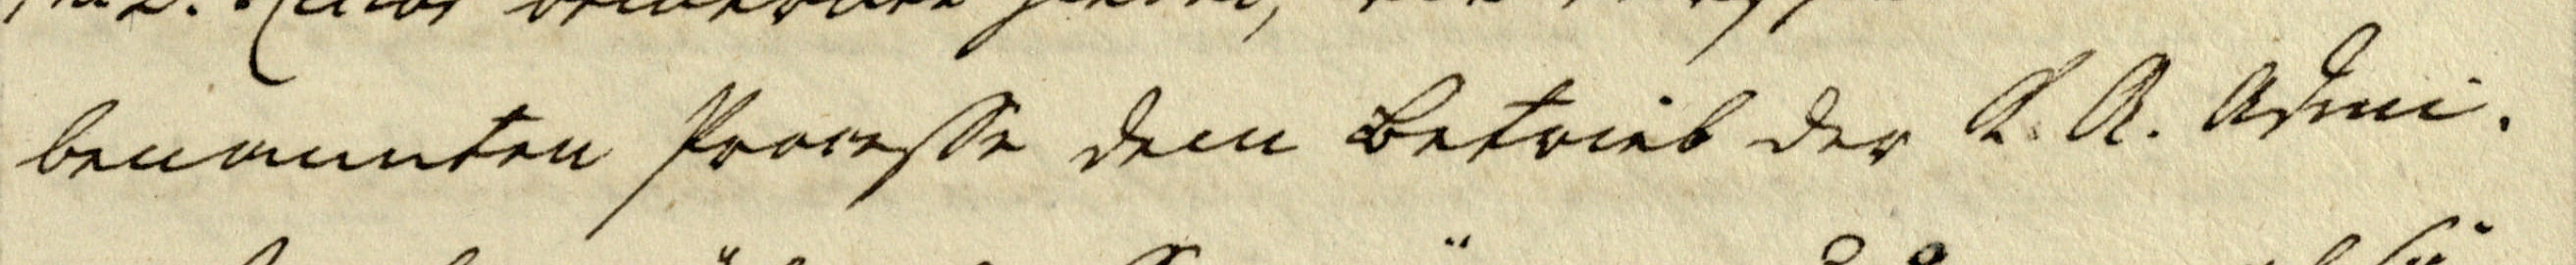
benannten Processe dem Betrieb der K. A. Admi¬
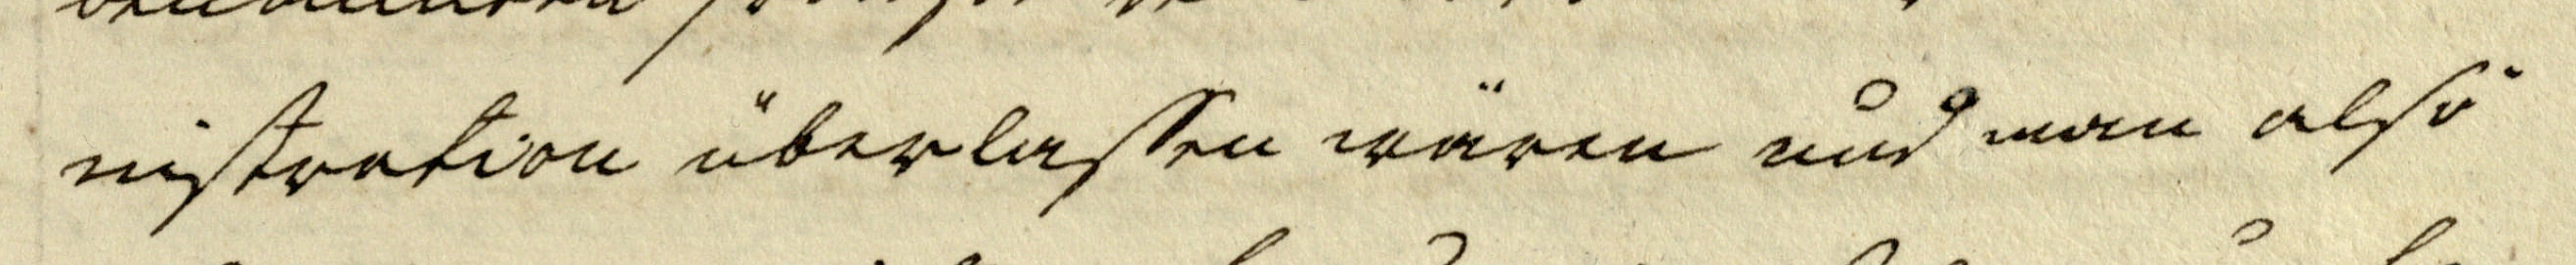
nistration überlassen wären und man also
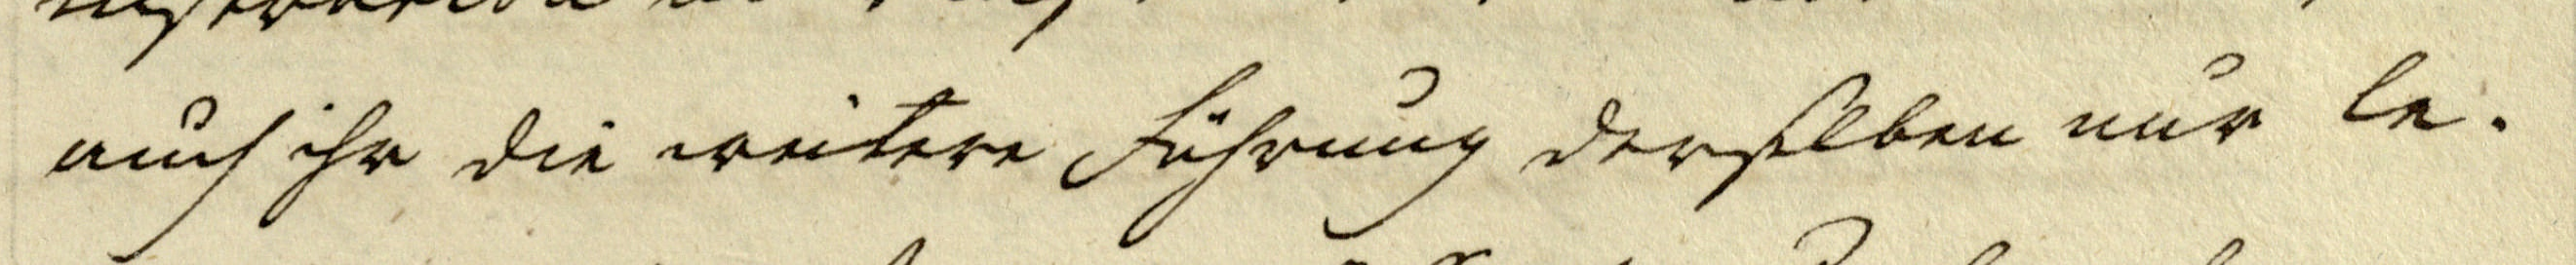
auch ihr die weitere Führung derselben nur le¬
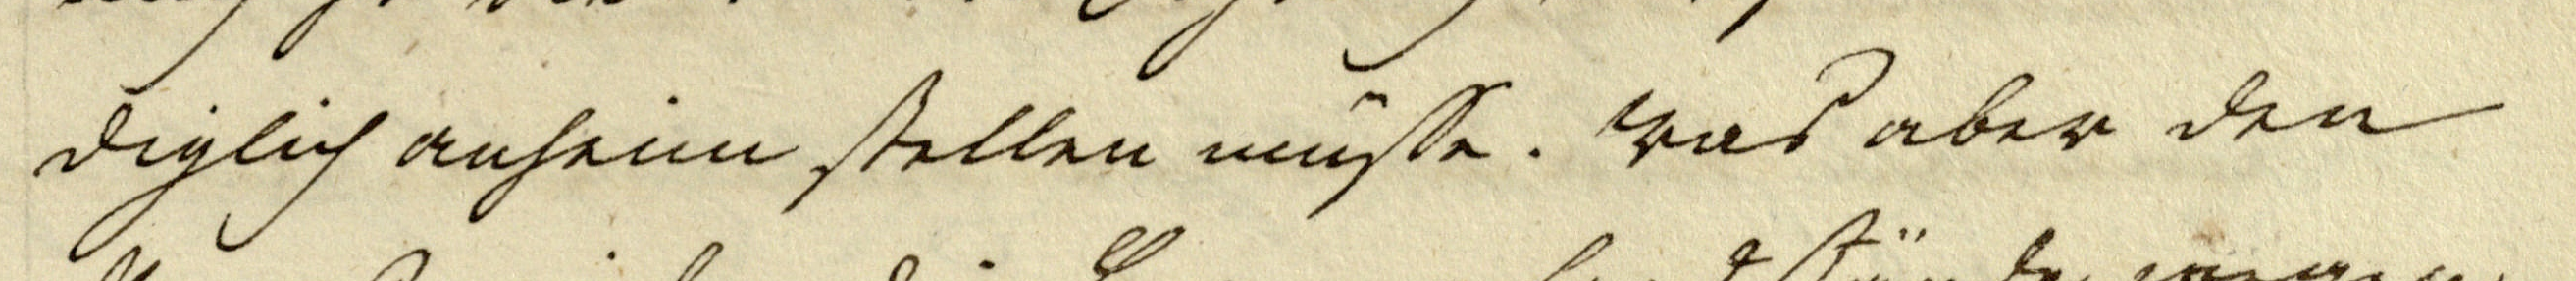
diglich anheim stellen müsse. Was aber den
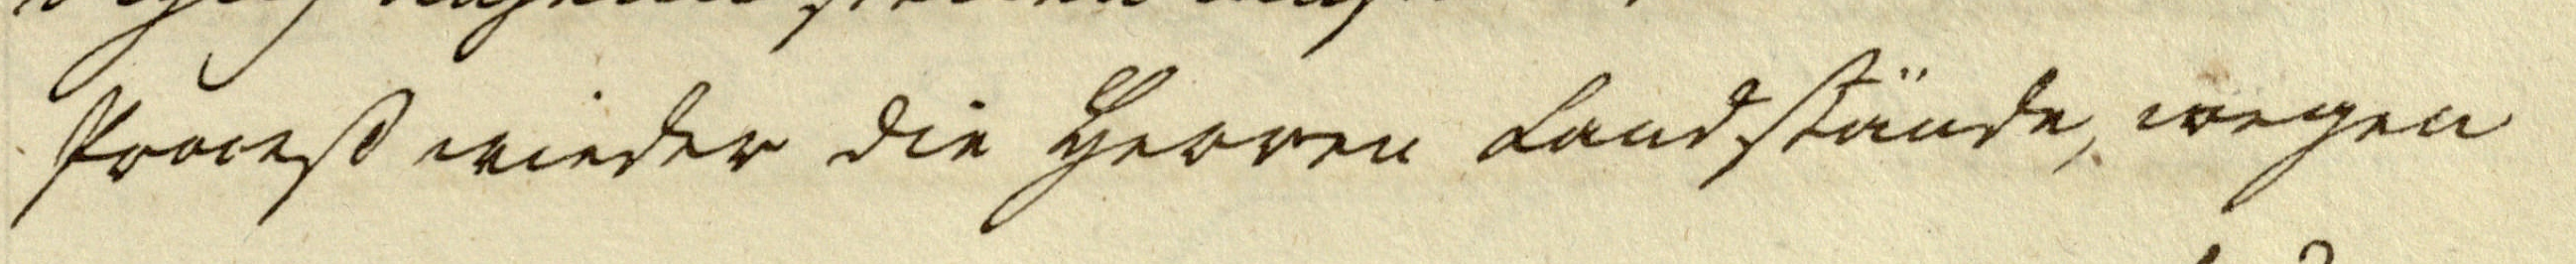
Proceß wieder die Herren Landstände, wegen
